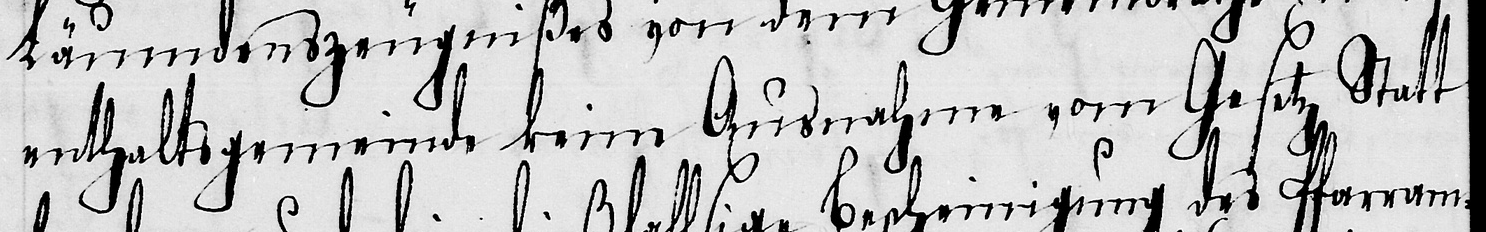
enthaltsgemeinde keine Ausnahme vom Gesetz Statt
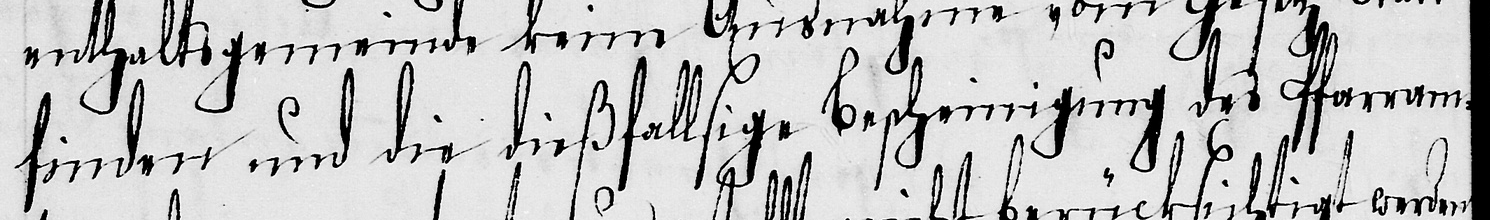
finden und die dießfallige Bescheinigung des Pfarram¬
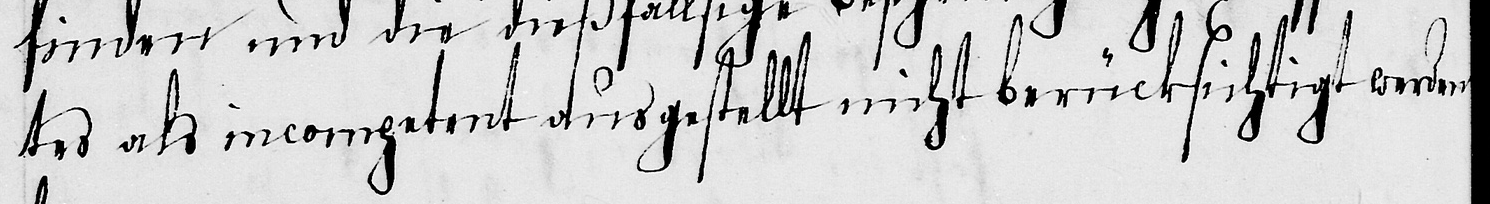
tes als incompetent ausgestellt nicht berücksichtigt werden
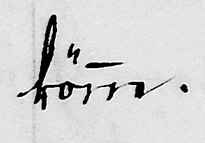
könne.
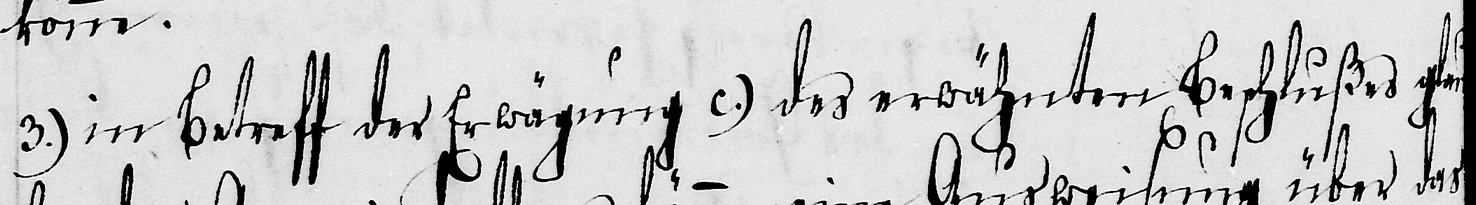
3.) in Betreff der Erwägung c.) des erwähnten Beschlußes gl¬
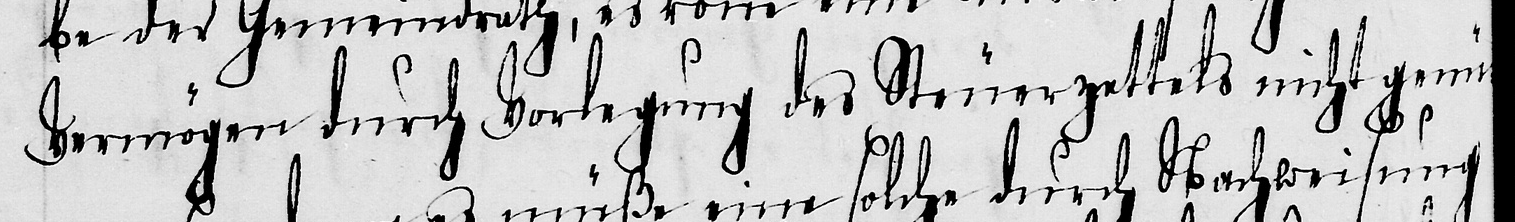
Vermögen durch Vorlegung des Steuerzettels nicht genü¬
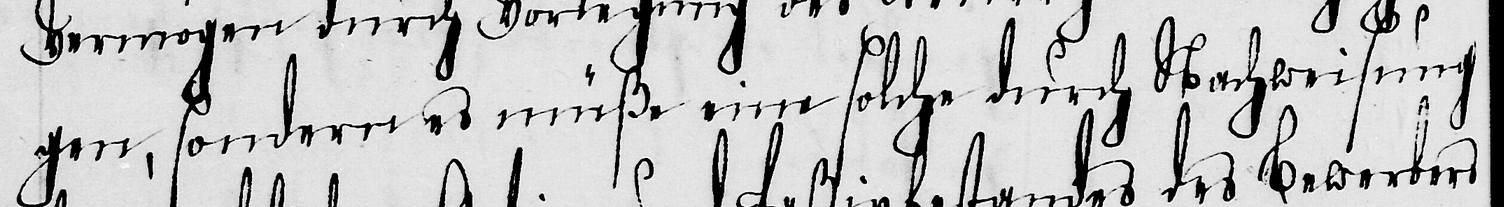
gen, sondern es müße eine solche durch Nachweisung
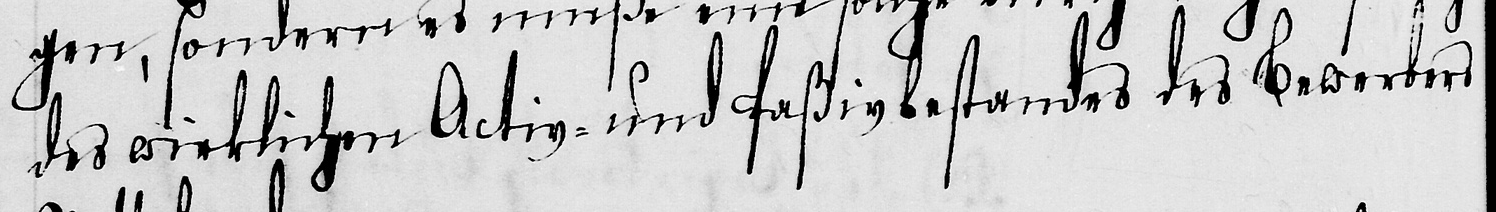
des wirklichen Activ- und Paßivbestandes des Bewerbers
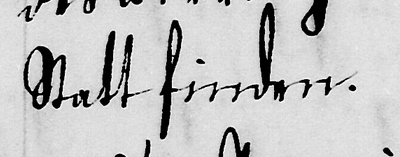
Statt finden.
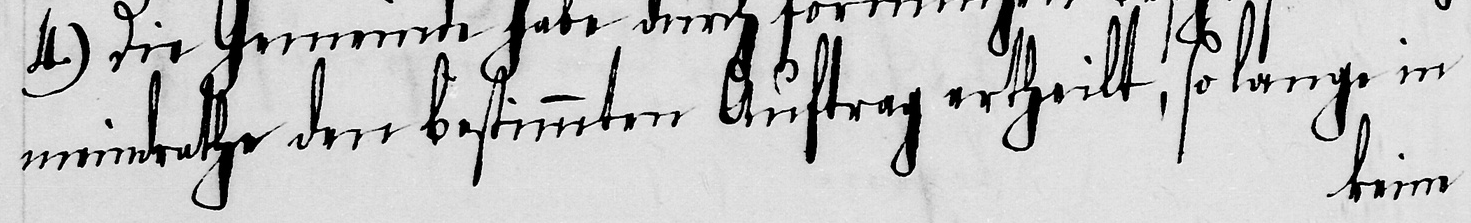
emeindrathe den bestimmten Auftrag ertheilt, so lange in
